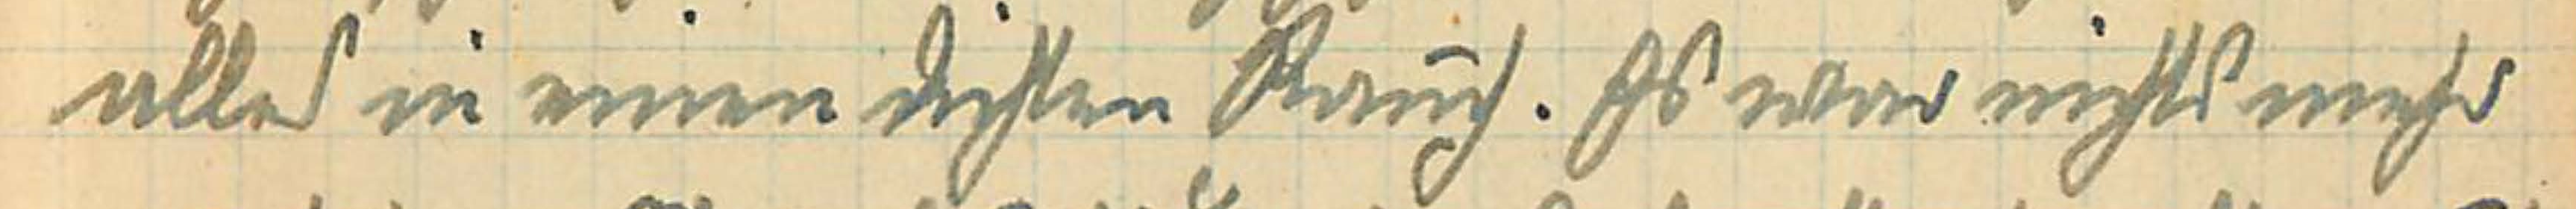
alles in einen dichten Rauch. Es war nichts mehr
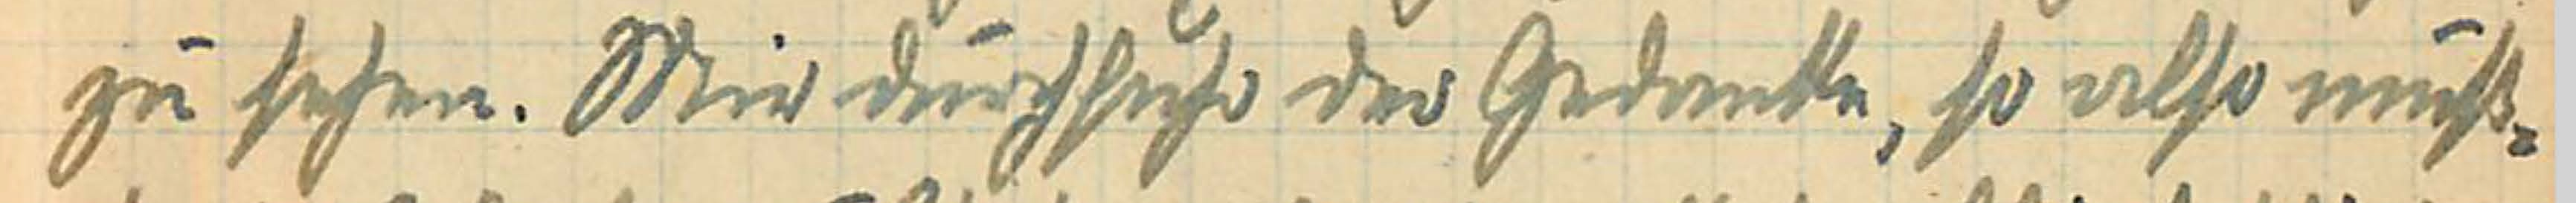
zu sehen. Mir durchfuhr der Gedanke, so also muß-
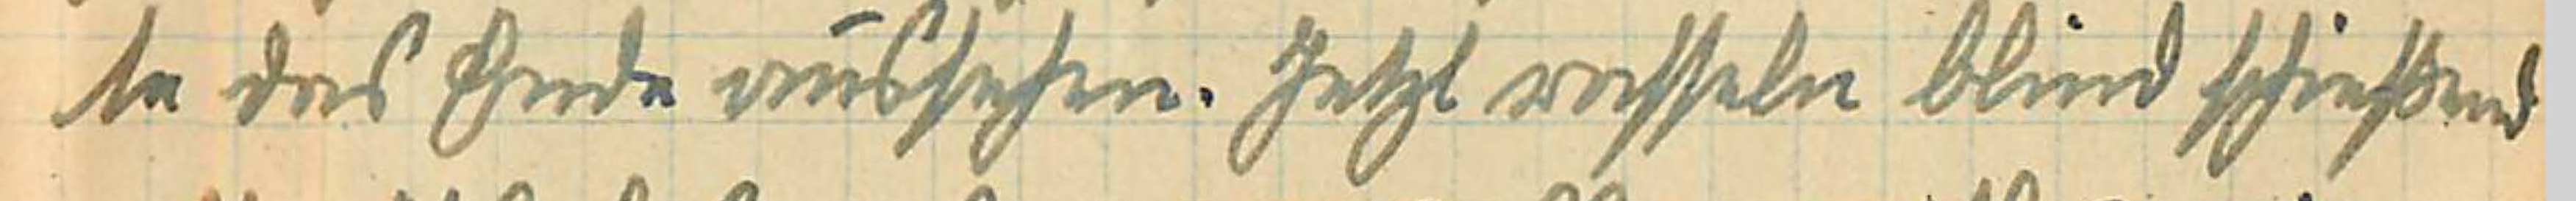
te das Ende aussehen. Jetzt rasseln blind schießend
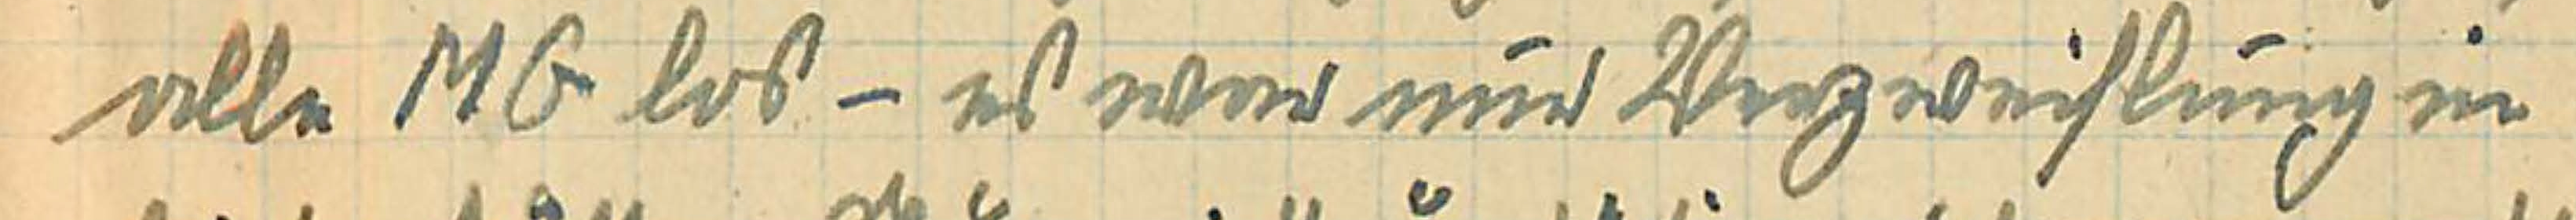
alle MG los – es war nur Verzweiflung in
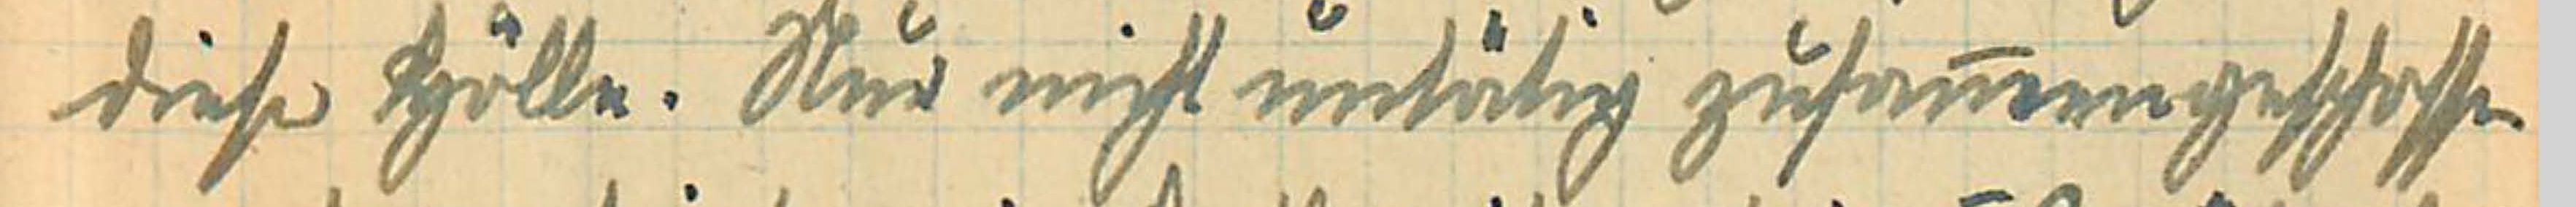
dieser Hölle. Nur nicht untätig zusammengeschossen
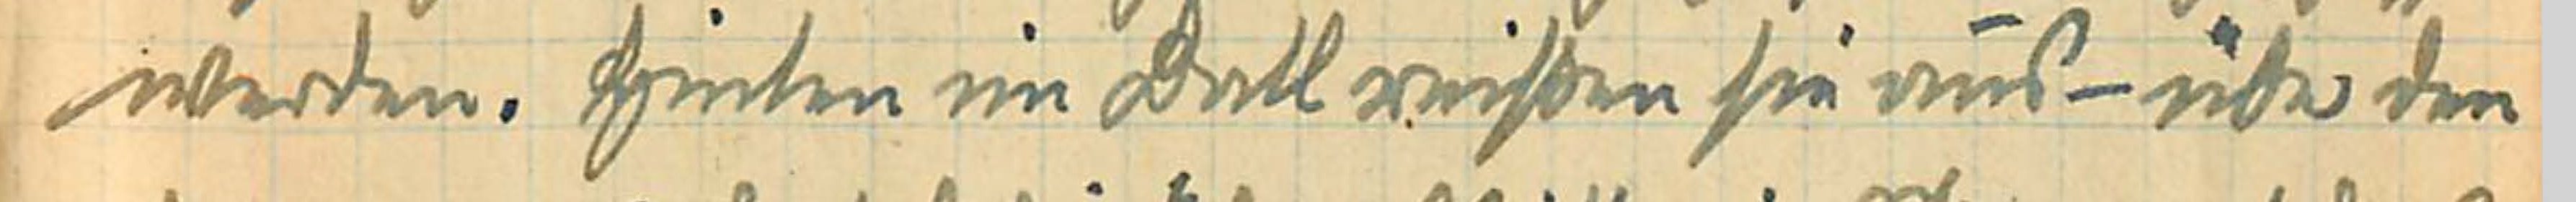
werden. Hinten im Batl reißen sie aus – über den
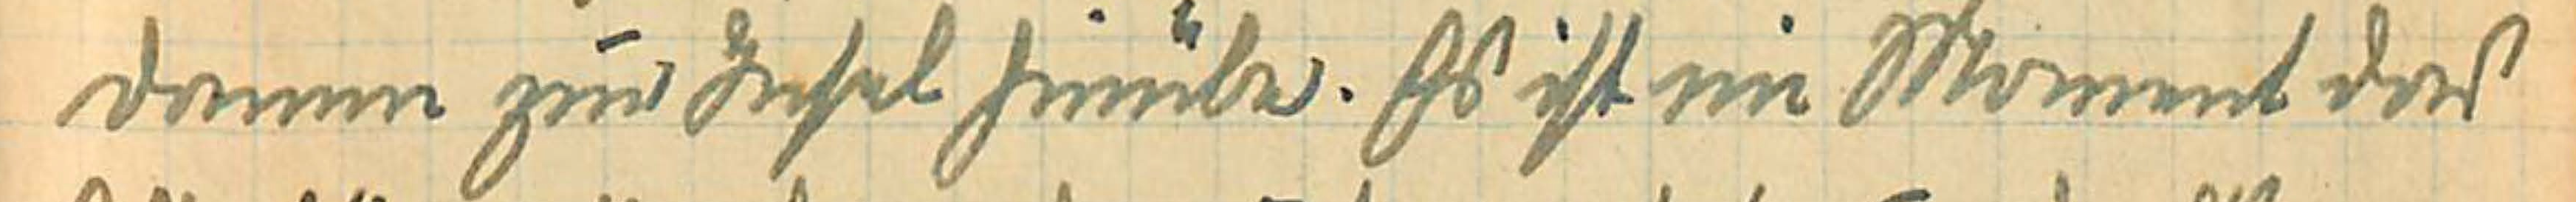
Damm zur Insel hinüber. Es ist im Moment das
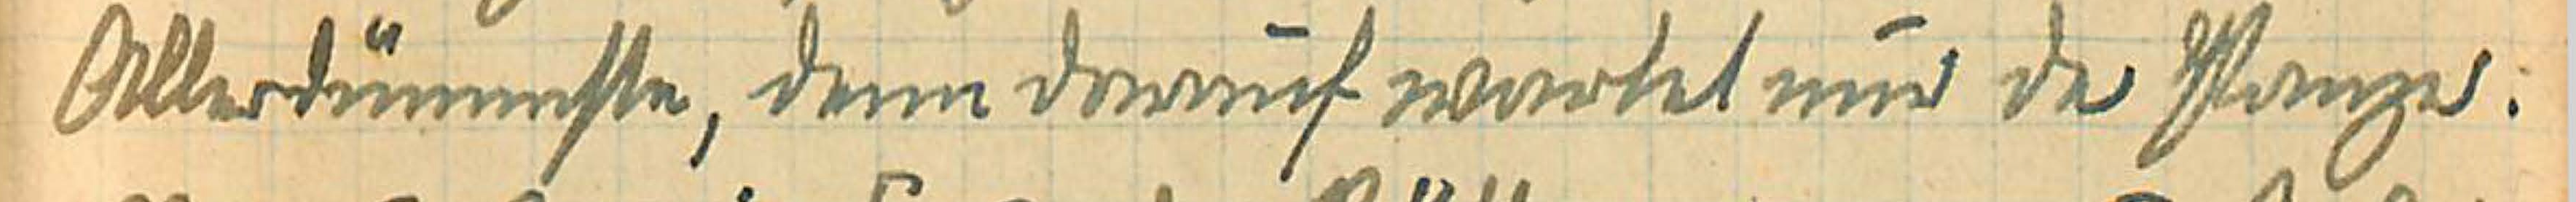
Allerdümmste, denn darauf wartet nur der Panzer.
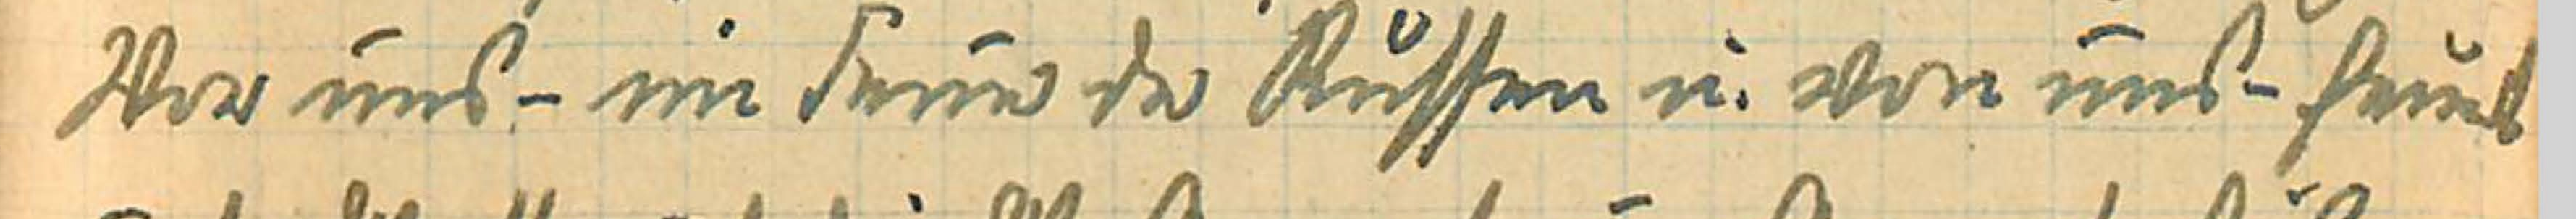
Vor uns – im Feuer der Russen u. von uns – feuert
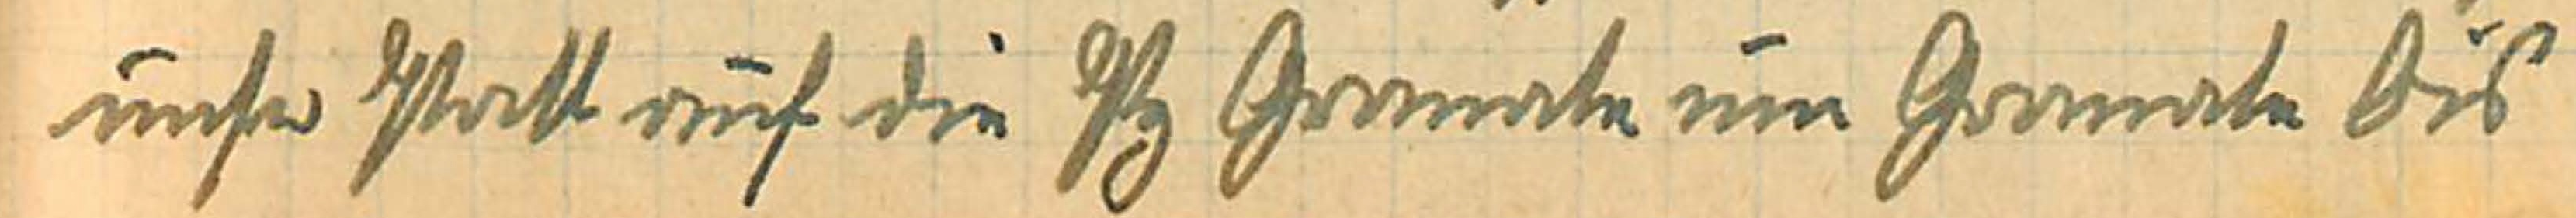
unser Pak auf die Pz Granate um Granate bis
